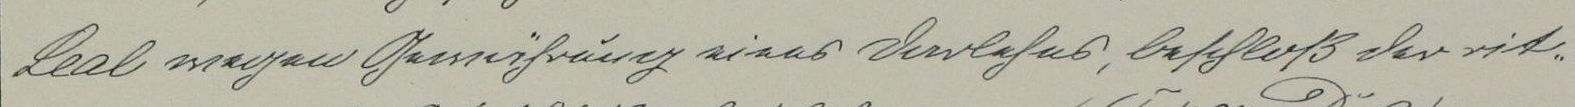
Leal wegen Gewährung eines Darlehns, beschloß der rit-
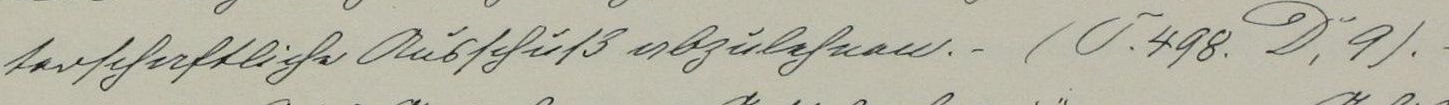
terschaftliche Ausschuß abzulehnen. - (T.498. D.9).
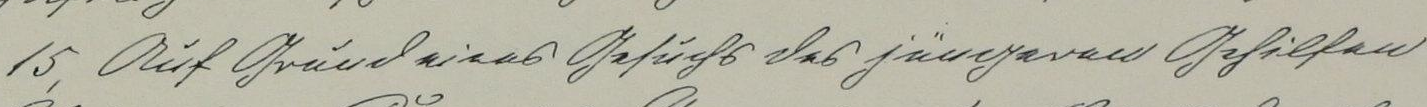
15. Auf Grund eines Gesuchs des jüngeren Gehilfen
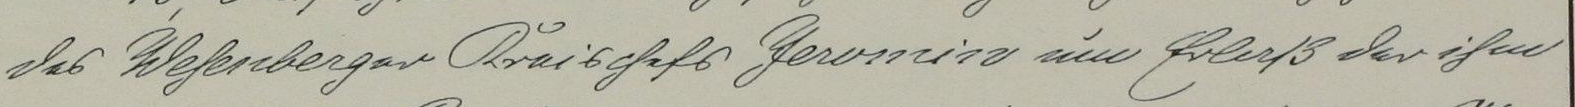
des Wesenberger Kreischefs Jeromin um Erlaß der ihm
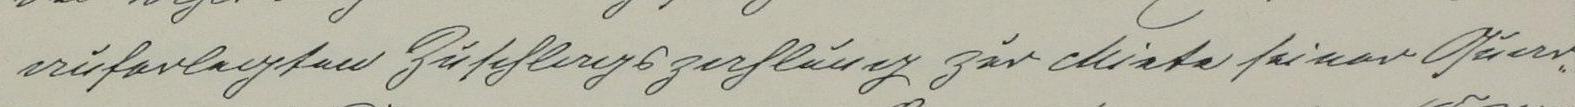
auferlegten Zuschlagszahlung zur Miete seiner Quar-
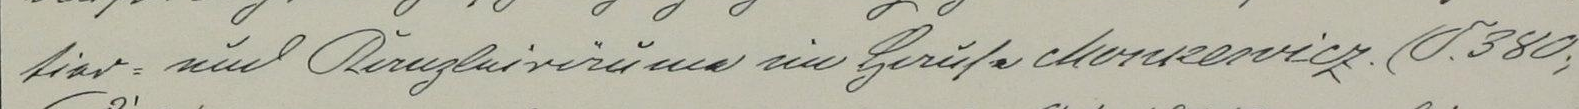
tier- und Kanzleiräume im Hause Monkewicz (T.380;
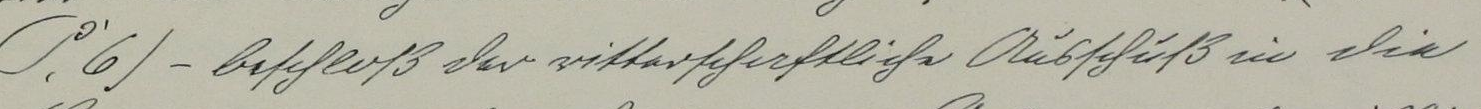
P.6) - beschloß der ritterschaftliche Ausschuß in die
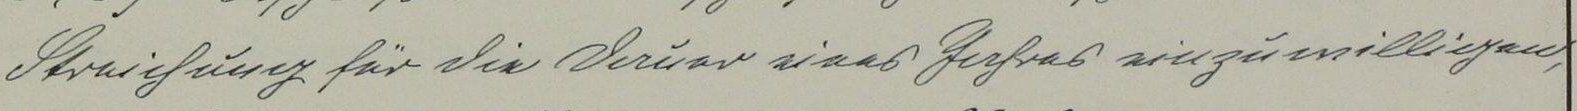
Streichung für die Dauer eines Jahres einzuwilligen,
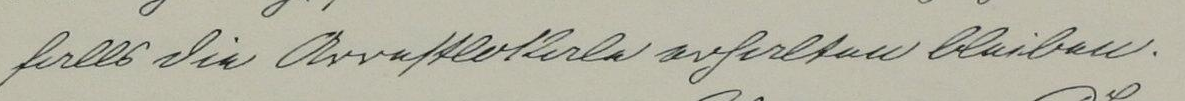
falls die Arrestlokale erhalten bleiben.
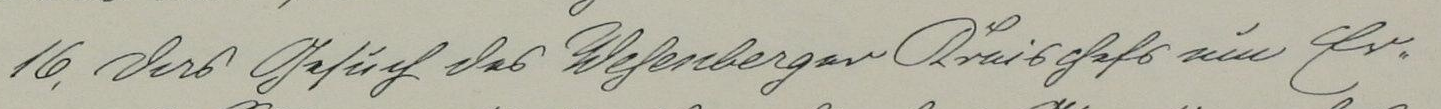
16. Das Gesuch des Wesenberger Kreischefs um Er-
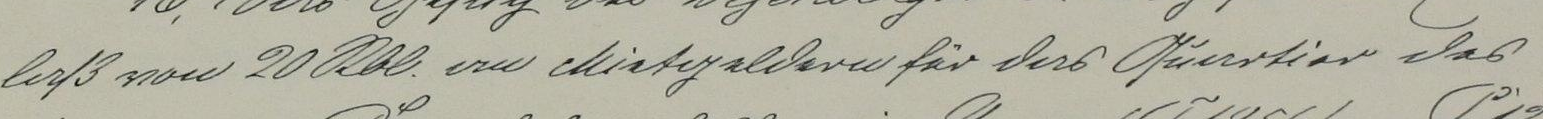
laß von 20 Rbl. an Mietgeldern für das Quartier des
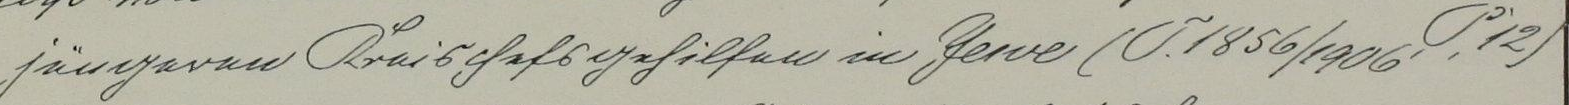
jüngeren Kreischefsgehilfen in Jewe (T.1856/1906, P.12)
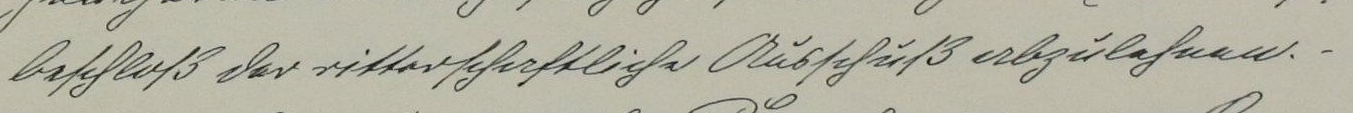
beschloß der ritterschaftliche Ausschuß abzulehnen.
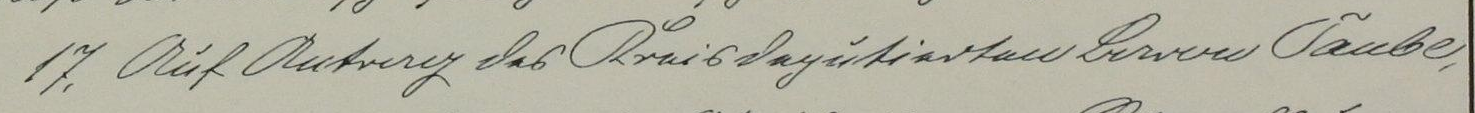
17. Auf Antrag des Kreisdeputierten Baron Taube,
